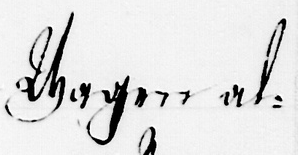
Wagen al¬
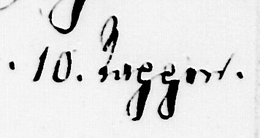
10. Rappen.
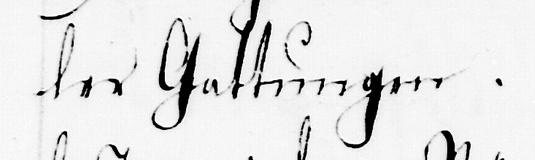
ler Gattungen
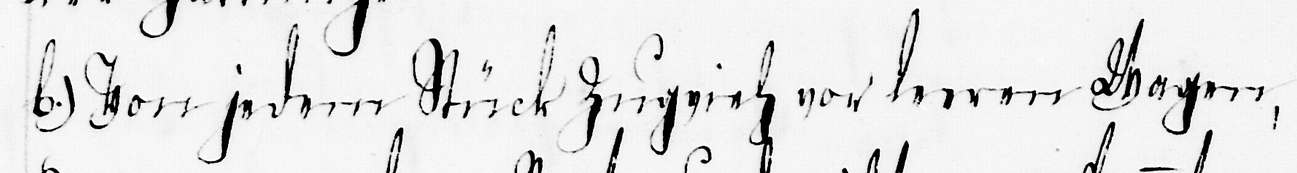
b.) Von jedem Stück Zugvieh vor leeren Wagen,
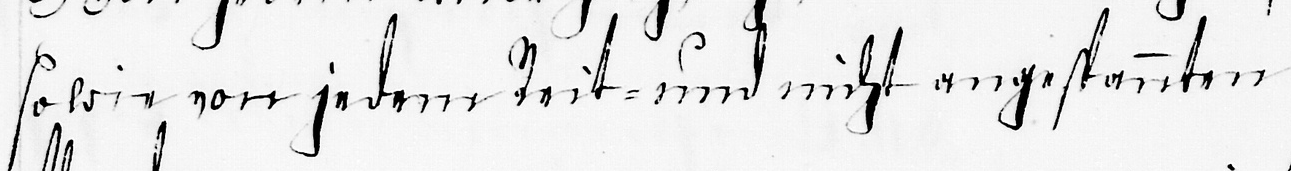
so wie von jedem Reit- und nicht angespannten
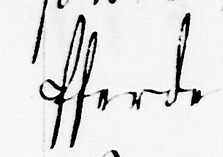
Pferde.
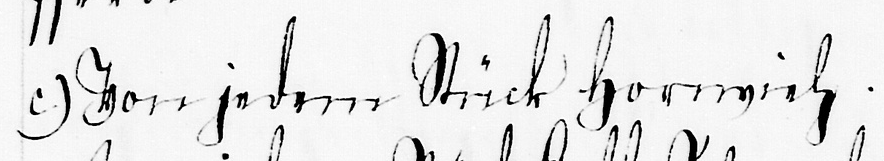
c.) Von jedem Stück Hornvieh.
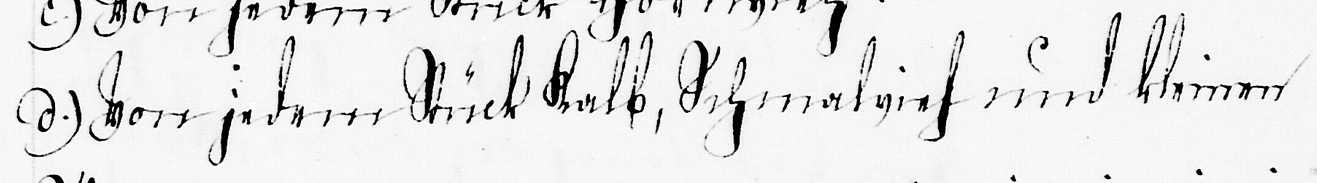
d.) Von jedem Stück Kalb, Schmalvieh und kleinen
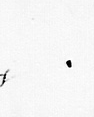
2.
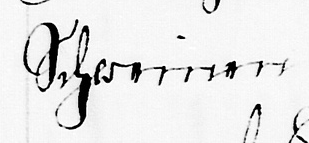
Schweinen
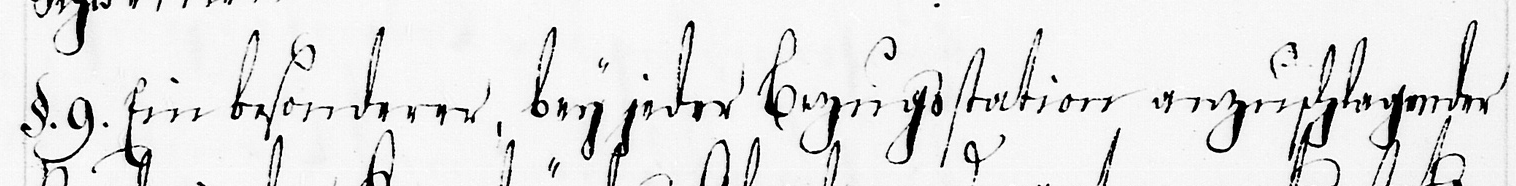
§. 9. Ein besonderer, bey jeder Bezugsstation anzuschlagender
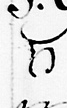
“
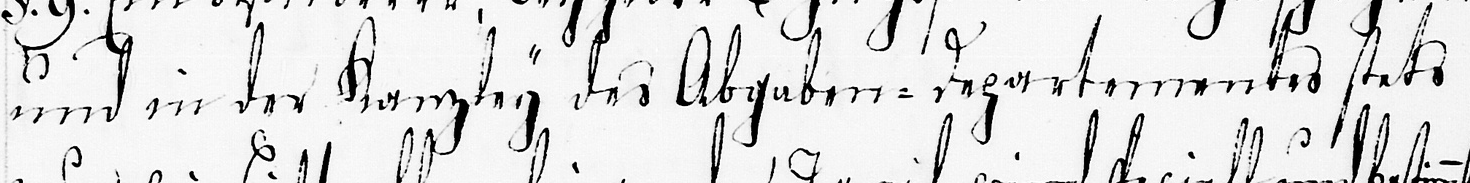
und in der Kanzley des Abgaben-Departementes stets
